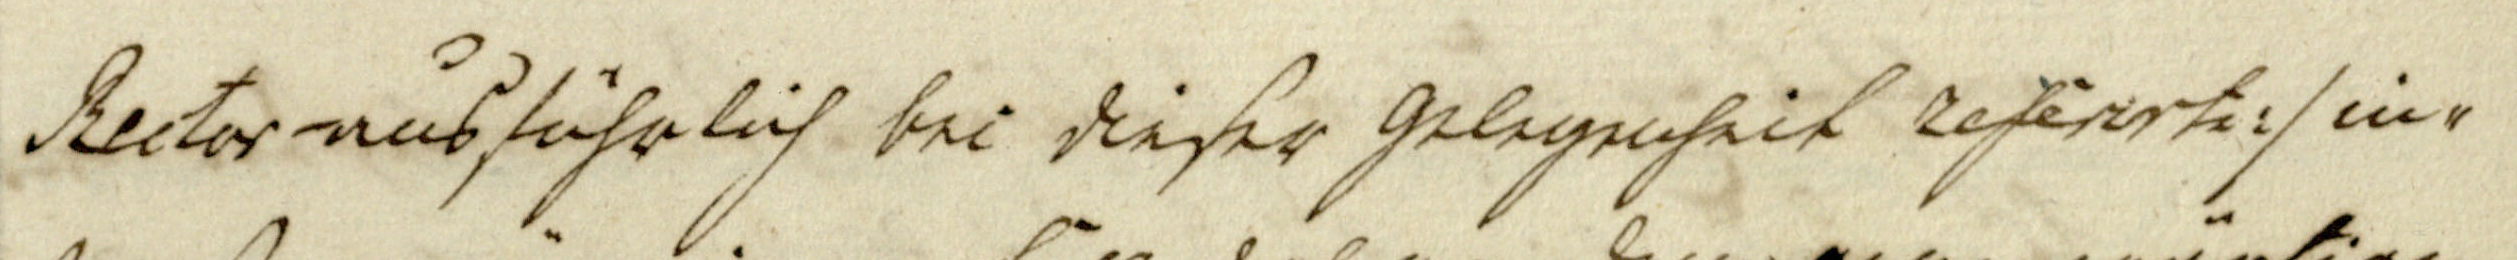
Rector ausführlich bei dieser Gelegenheit referirte / in¬
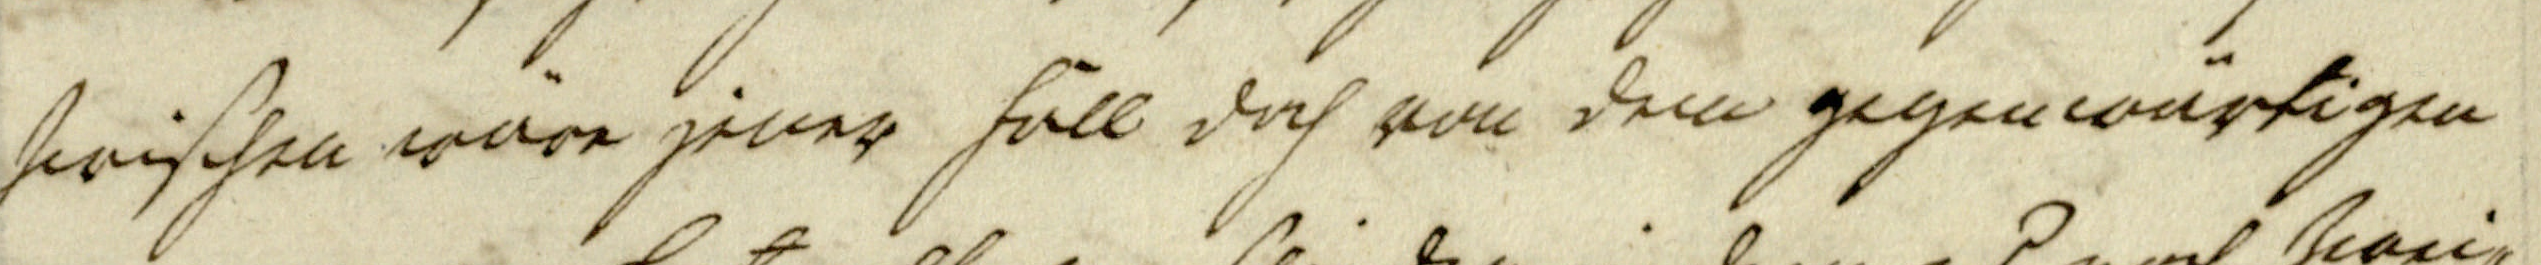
zwischen wäre jener Fall doch von dem gegenwärtigen
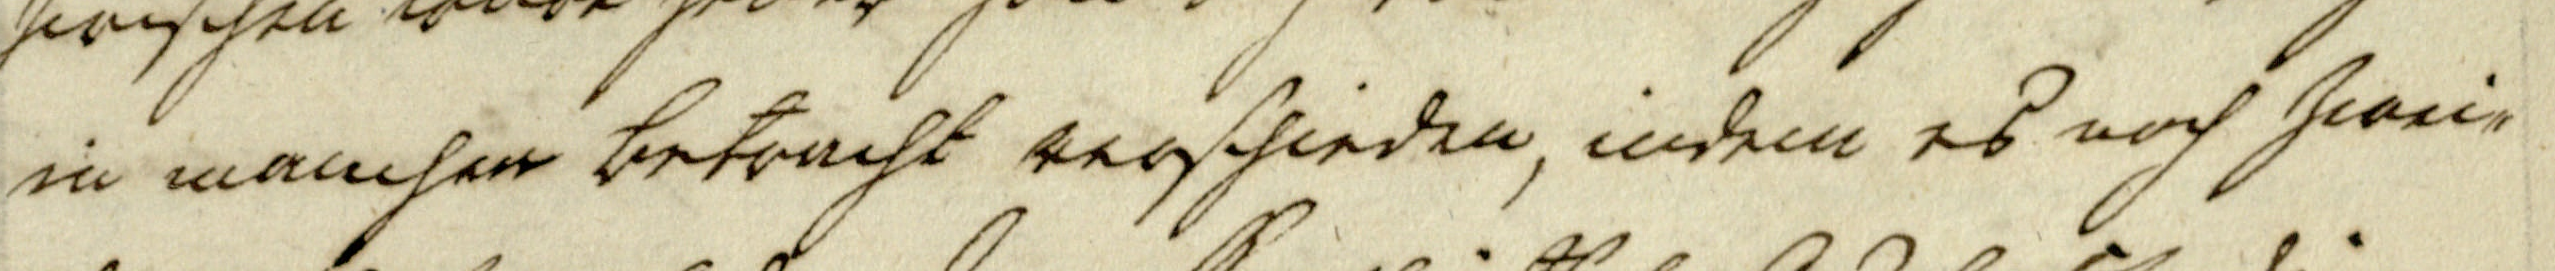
in manchen Betracht verschieden, indem es noch zwei¬
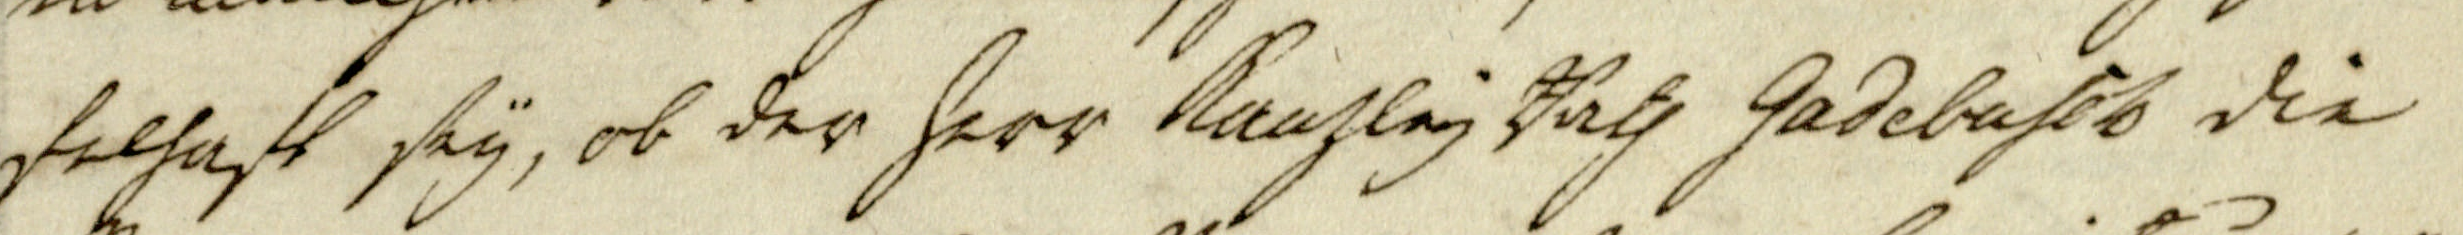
felhaft seÿ, ob der herr Kanzleÿ Rath Gadebusch die
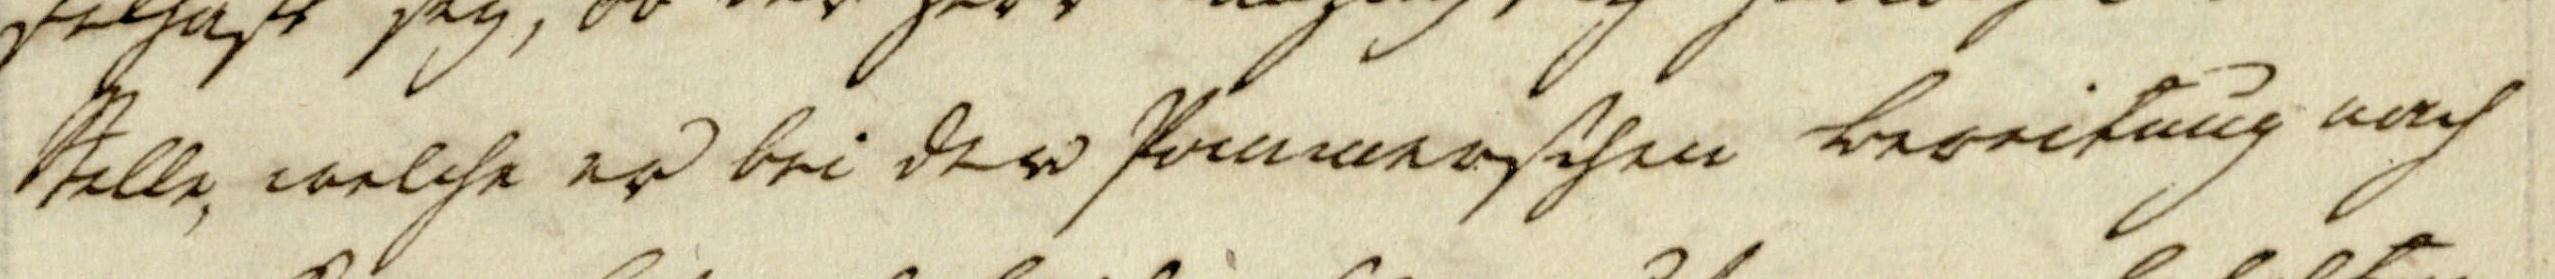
Stelle, welche er bei der Pommerschen Bereitung nach
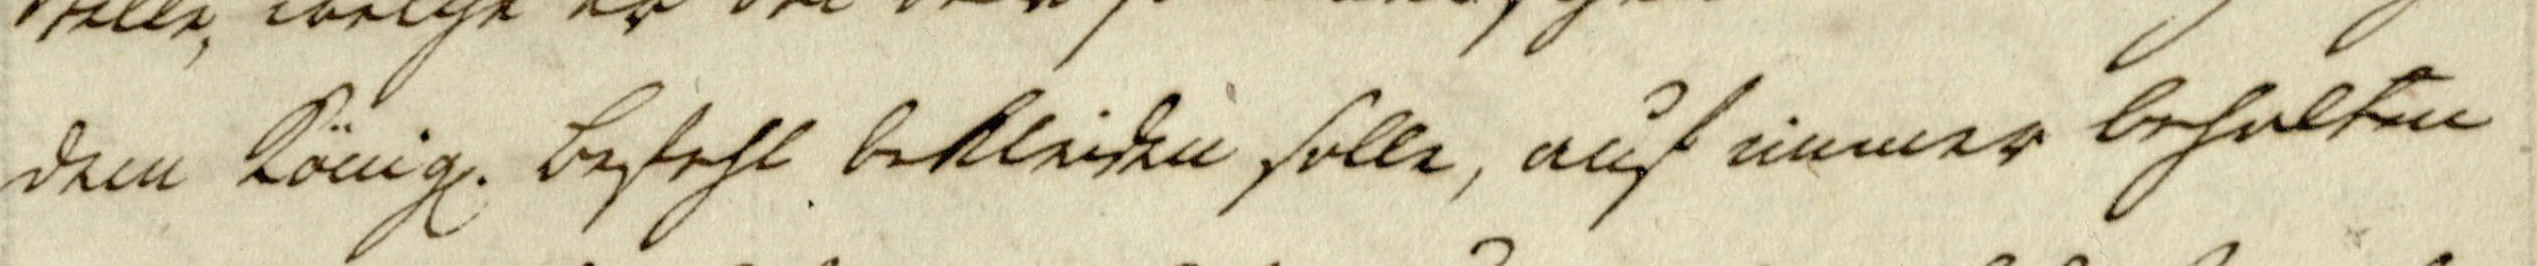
dem Königl. Befehl bekleiden solle, auf immer behalten
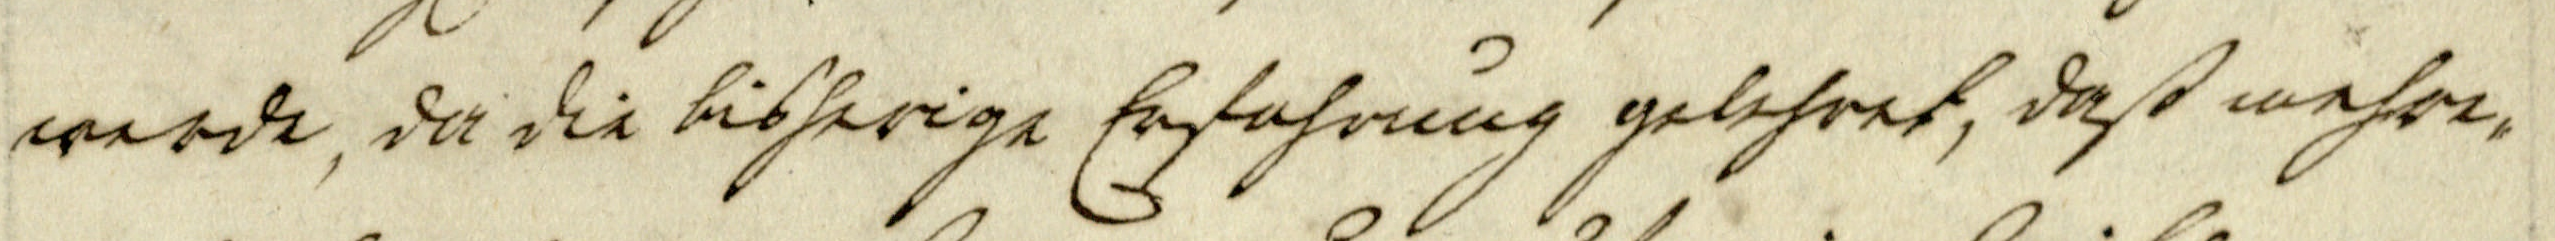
werde, da die bisherige Erfahrung gelehret, daß mehre¬
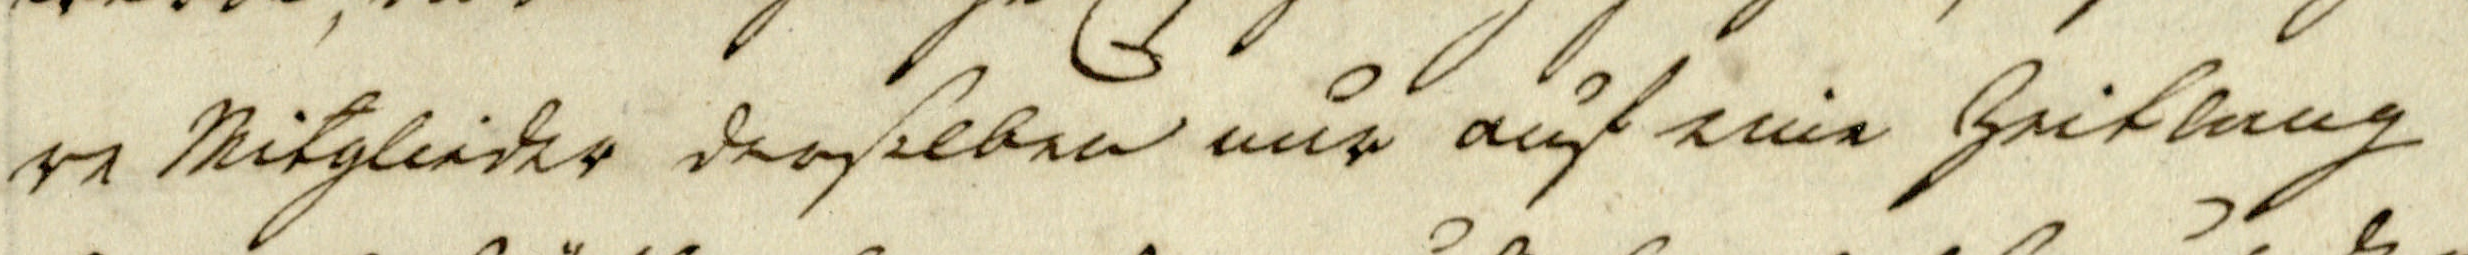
re Mitglieder derselben nur auf eine Zeitlang
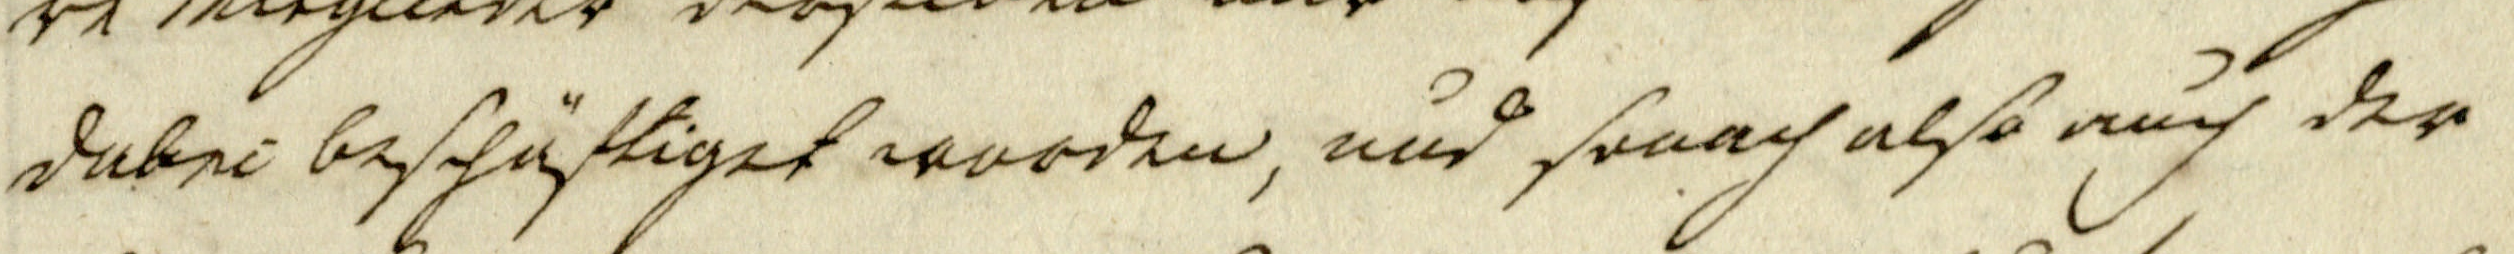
dabei beschäftiget worden, und sonach also auch der
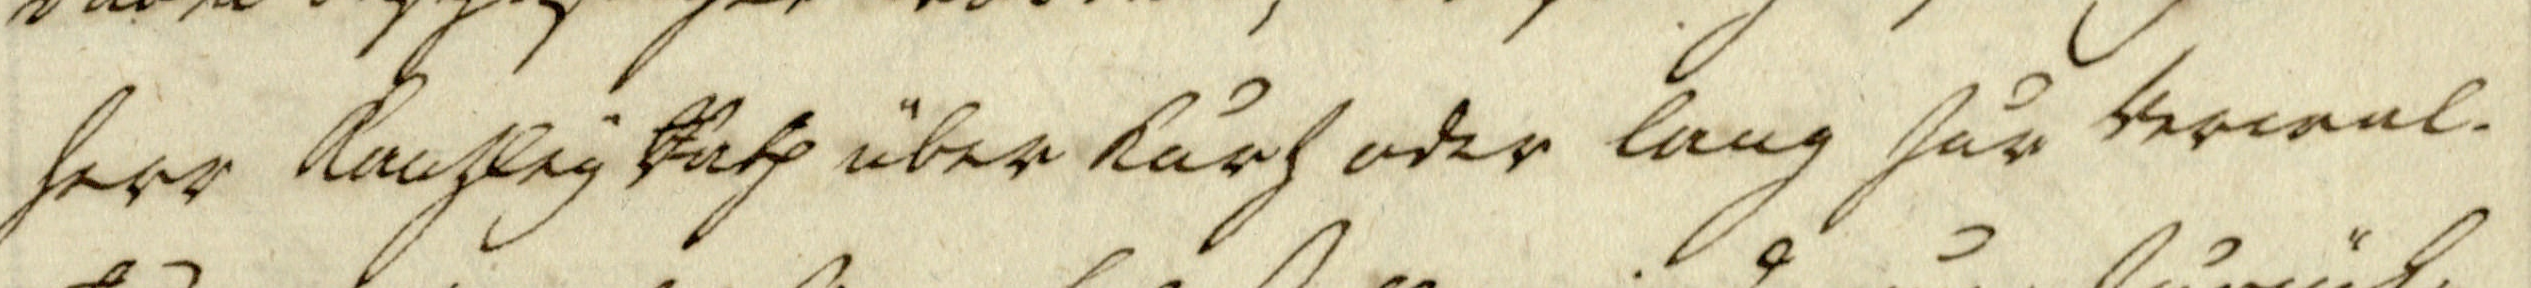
herr Kanzleÿ Rath über kurz oder lang zur Verwal¬
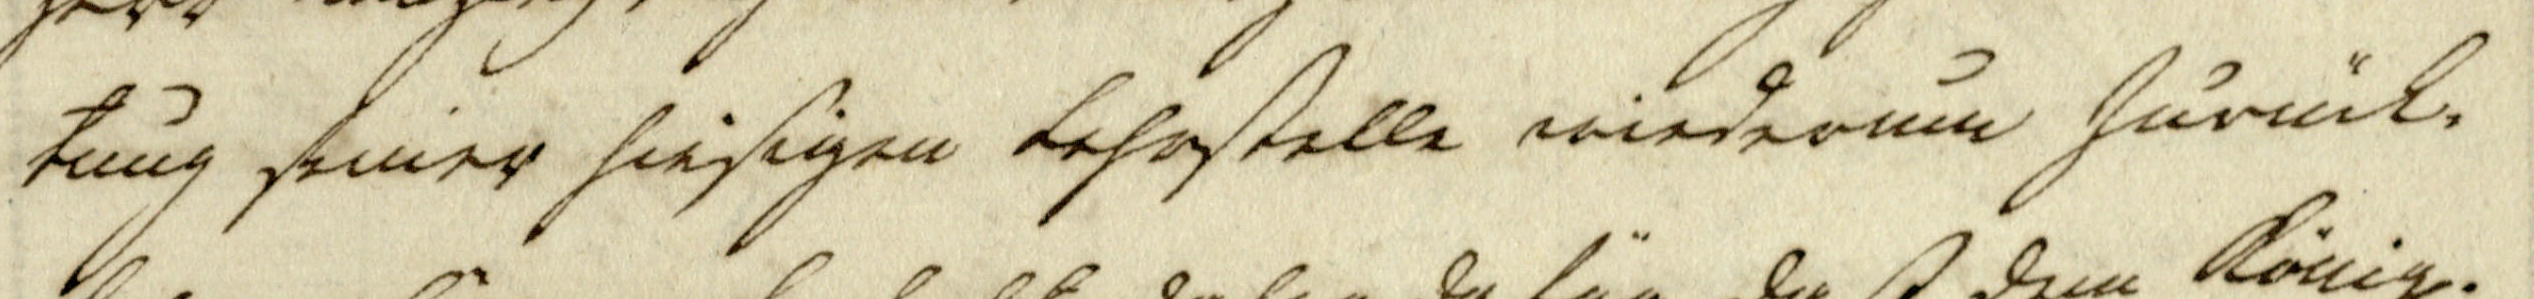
tung seiner hiesigen Lehrstelle wiederum zurück¬
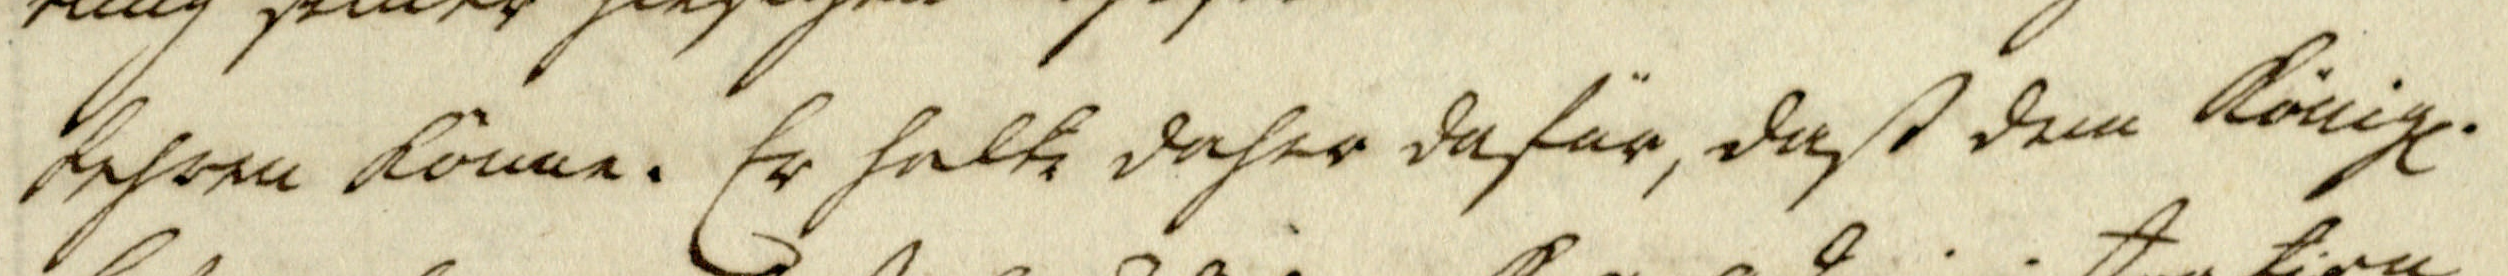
kehren könne. Er halte daher dafür, daß dem Königl.
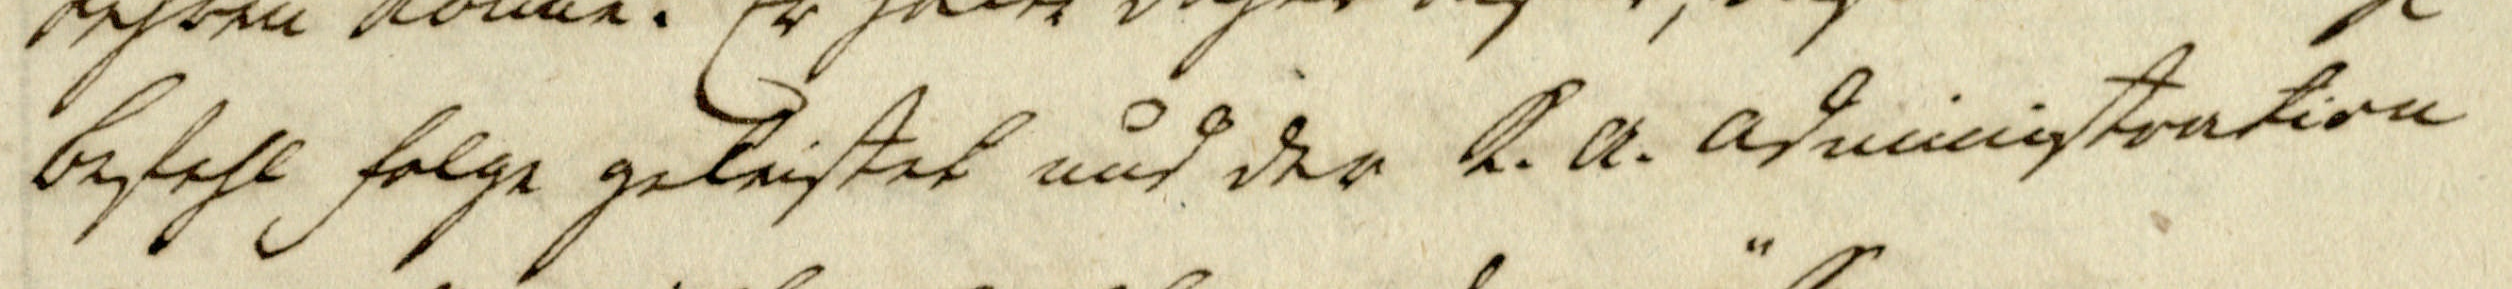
Befehl Folge geleistet und der K. A. Administration
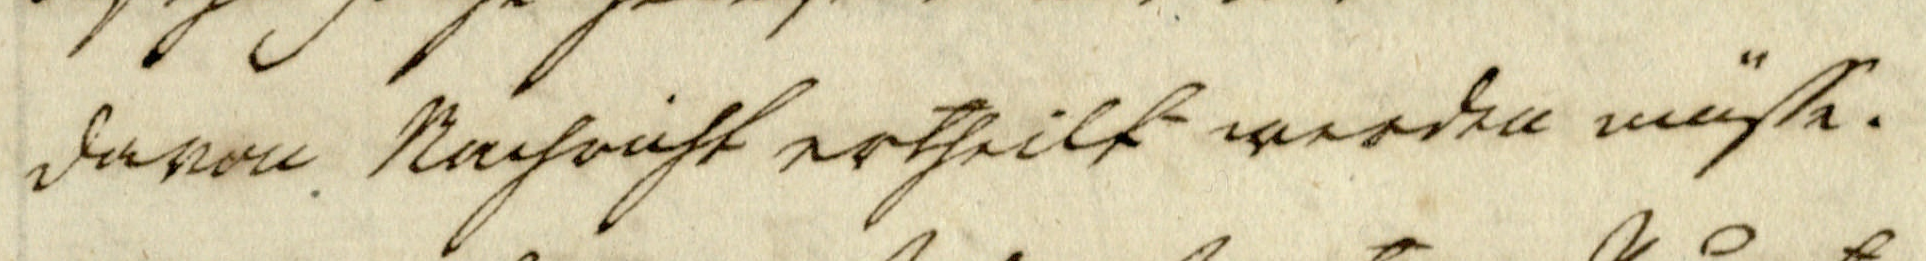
davon Nachricht ertheilt werden müsse.
